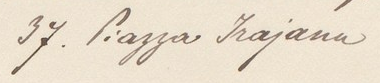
37. Piazza Trajana
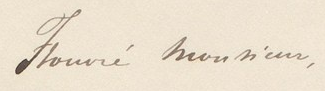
Honoré Monsieur,
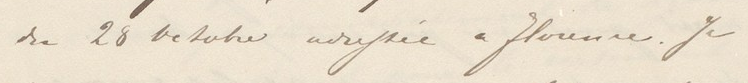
du 28 Octobre adressée a Florence. Je
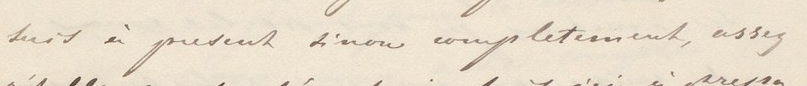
suis à present sinon completement, assez
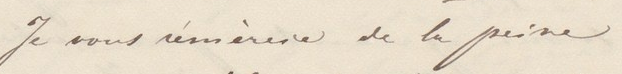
Je vous rémèrcie de la peine
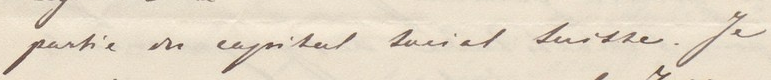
partie du capital social Suisse. Je
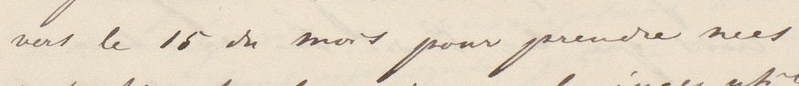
vers le 15 du mois pour prendre mes enfants,
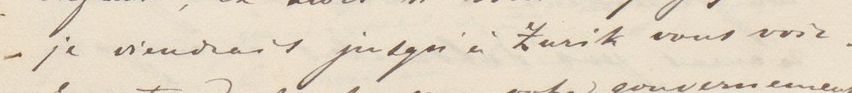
je viendrais jusqu'à Zurik vous voir.
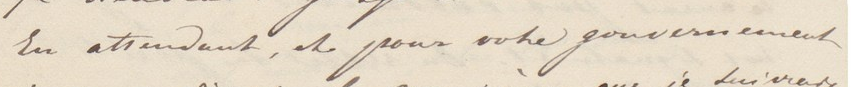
En attendant, et pour votre gouvernement
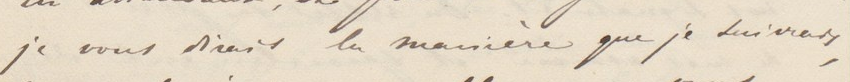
je vous dirais la manière que je suivais,
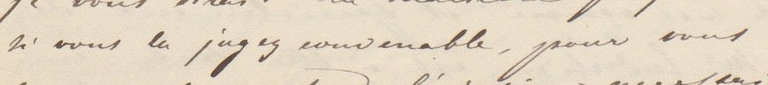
si vou la jugez convenable, pour vous
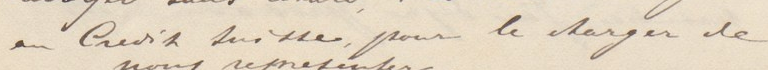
au Credit suisse, pour le charger de
